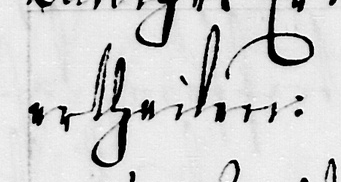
ertheilen:
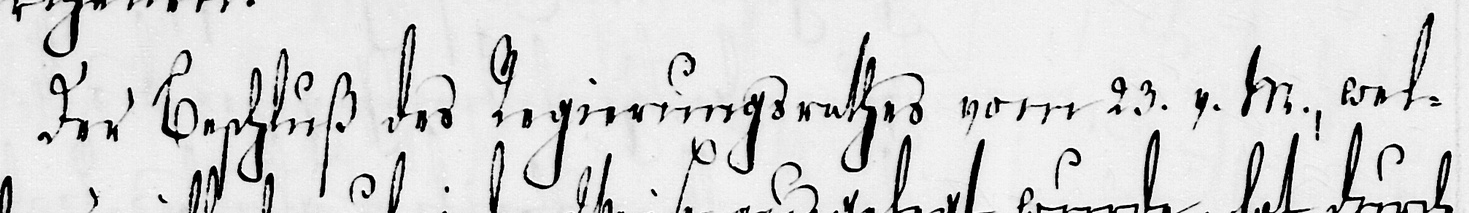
Der Beschluß des Regierungsrathes vom 23. v. M., wel¬
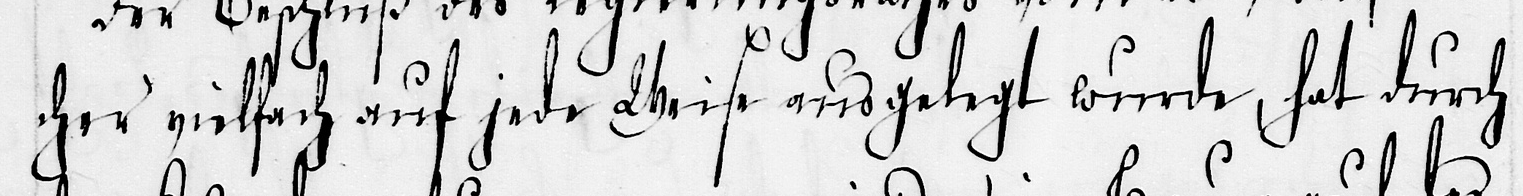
cher vielfach auf jede Weise ausgelegt wurde, hat durch
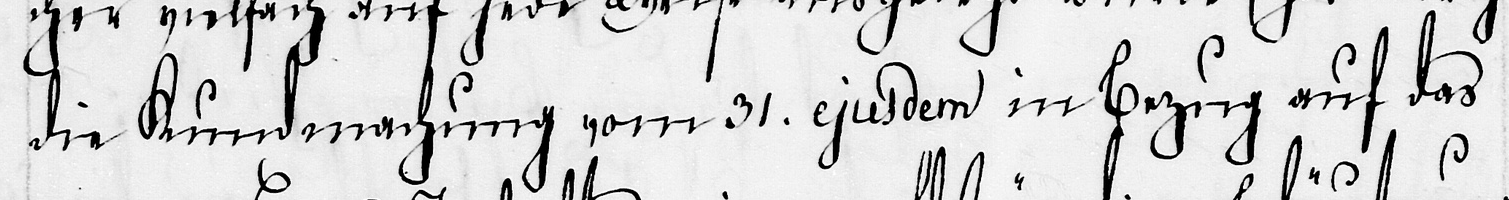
die Kundmachung vom 31. ejusdem in Bezug auf das
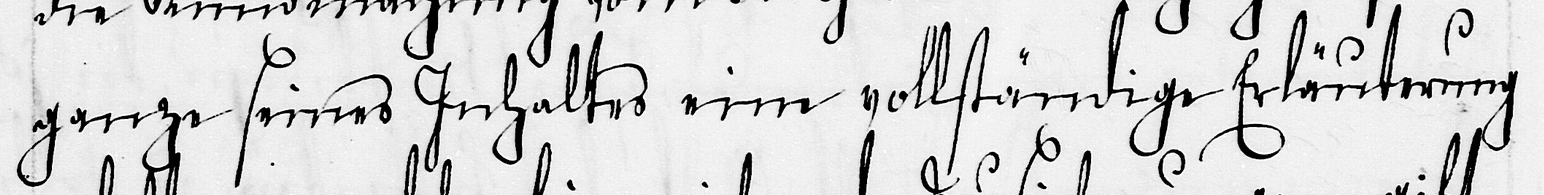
ganze seines Inhaltes eine vollständige Erläuterung
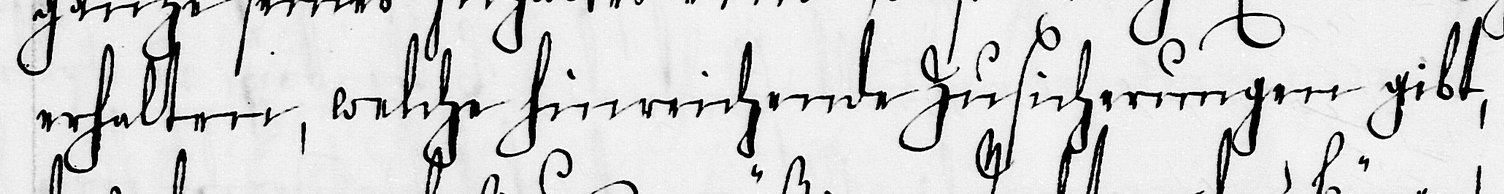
erhalten, welche hinreichende Zusicherungen gibt,
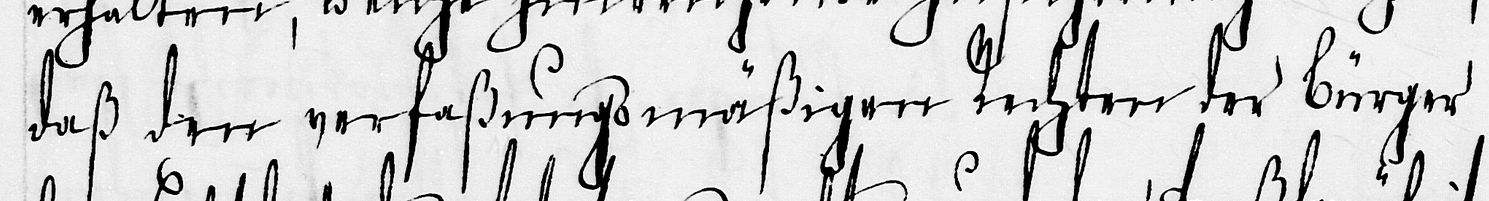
daß den verfaßungsmäßigen Rechten der Bürger
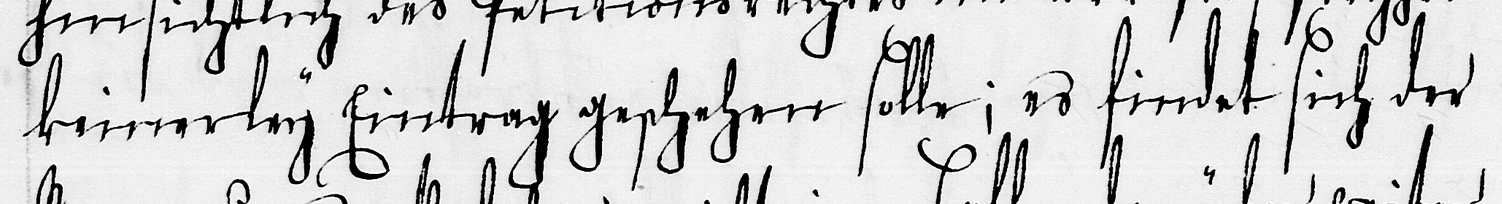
keinerley Eintrag geschehen solle; es findet sich der
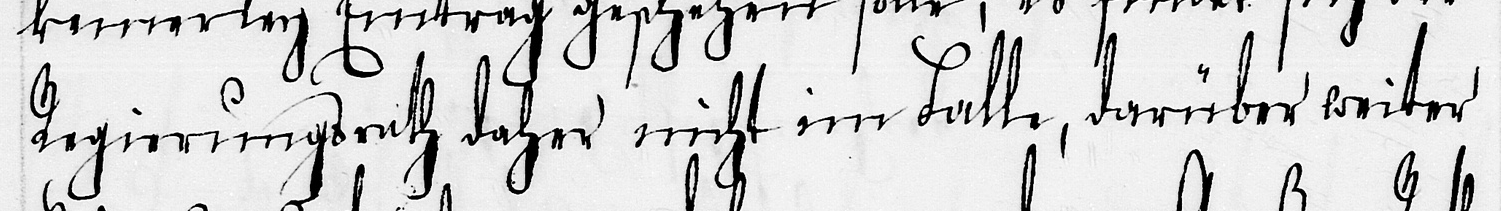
Regierungsrath daher nicht im Falle, darüber weiter
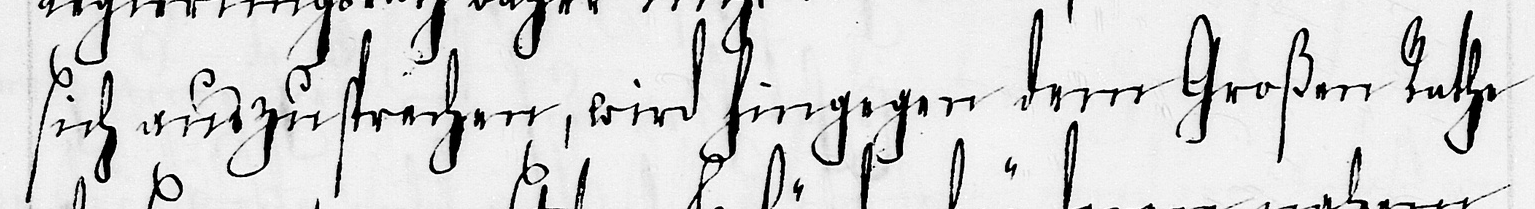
sich auszusprechen, wird hingegen dem Großen Rathe
